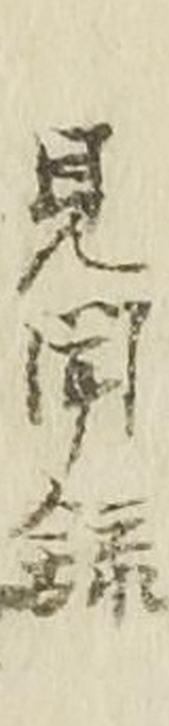見聞録
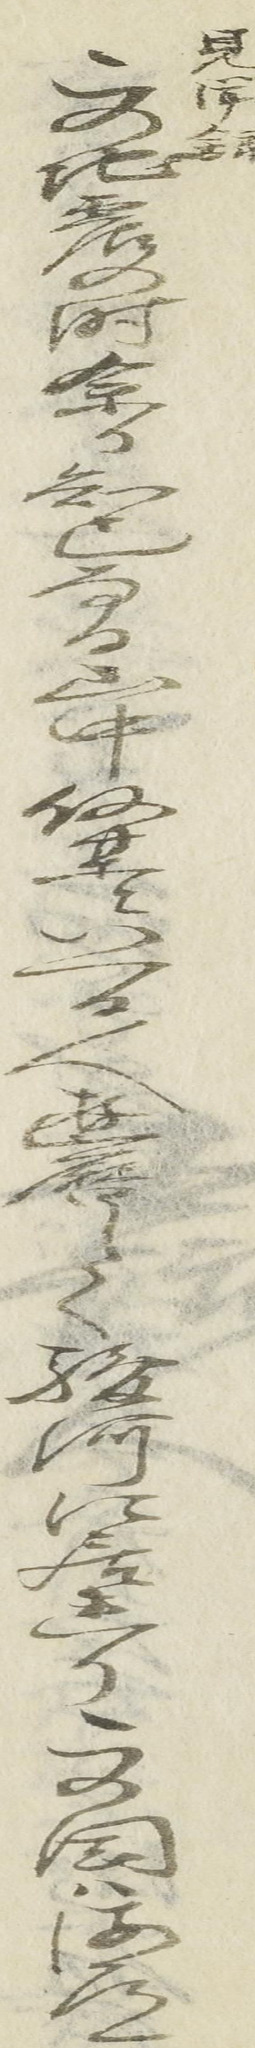一この地震の時余か知己なる山中何某といへる人遊歴して駿河に居れりこの国ハ海道
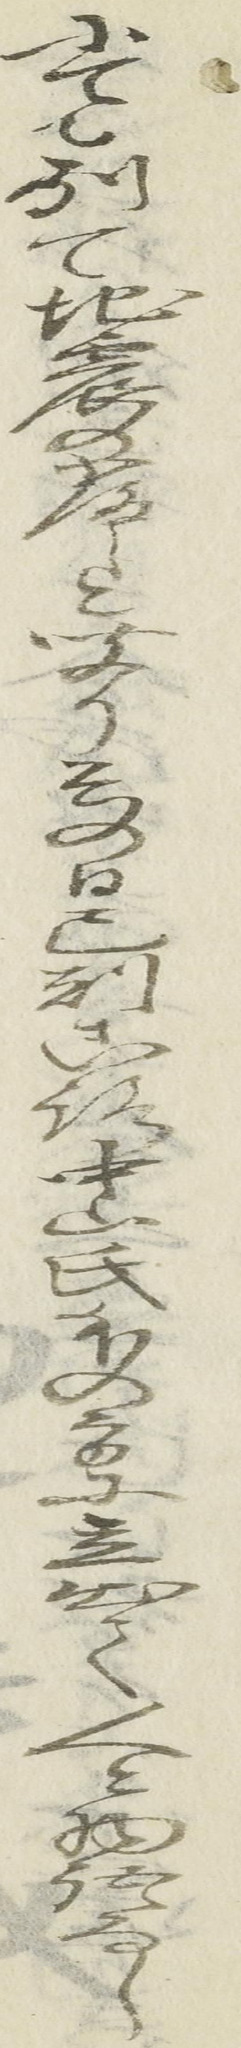ニても別て地震の厳しと聞りその日巳刻ころ中山氏外の方に立出て人と物語なし
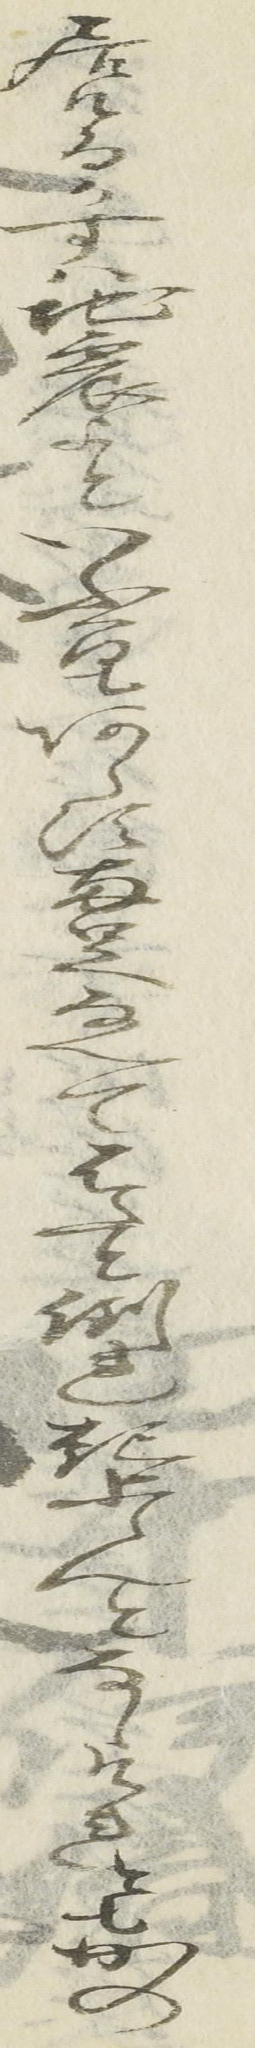居ケるかすハ地震よといふ間もあらす両足なへてはたと倒れ起上らんとなしケれともかの
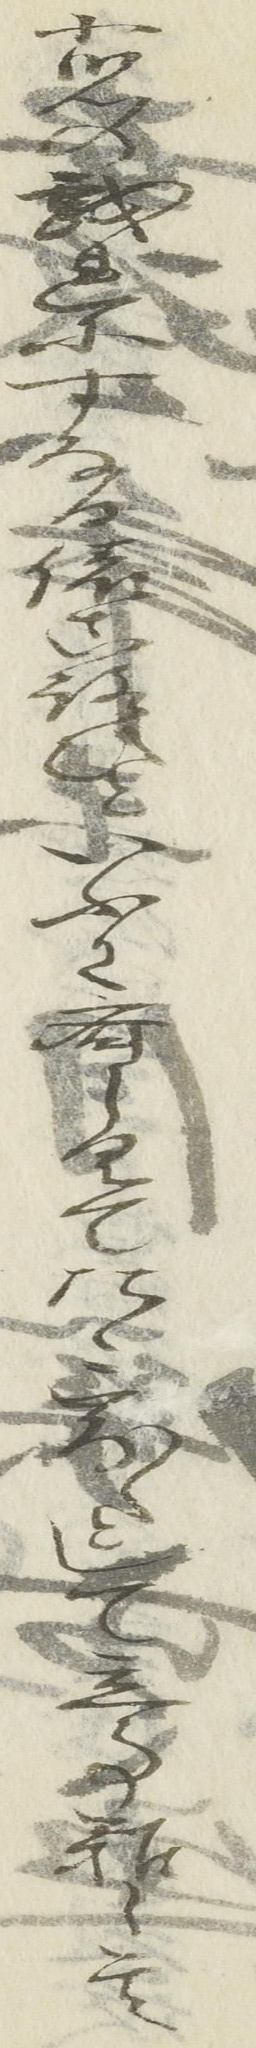小児の戯れにすなる俵ころかしといふに斉しくてたゝころ〳〵として立事難し其
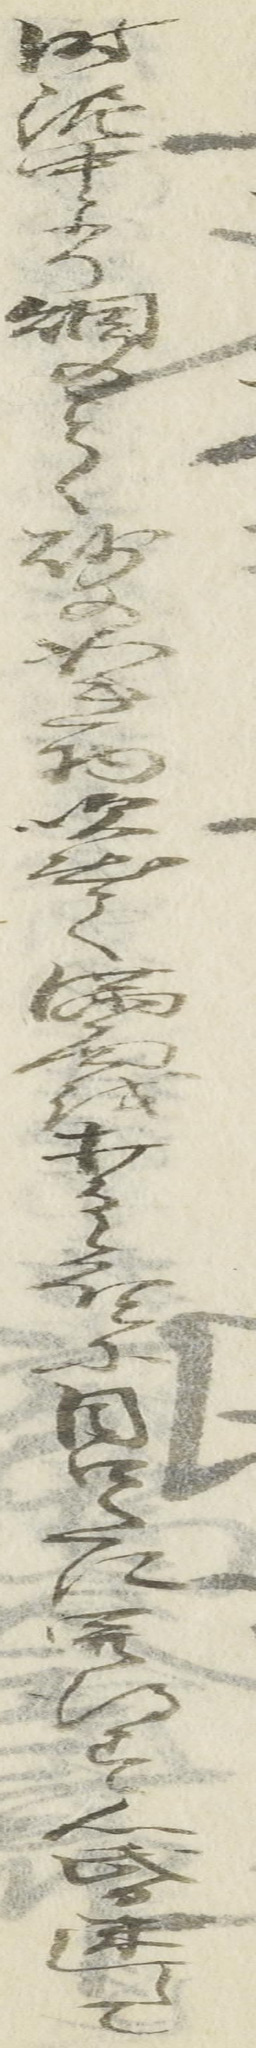時泥中より烟のことく砂の如き物吹出て満面を打るゝほとに目口たに開得す心昏迷して
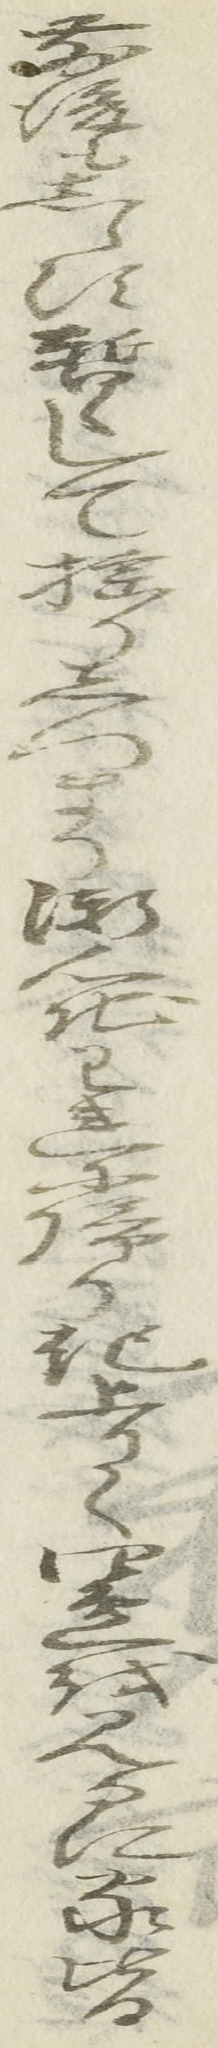前後もしらす暫くして揺りしつまり漸心地われに帰り起上りて四辺を見るに家皆
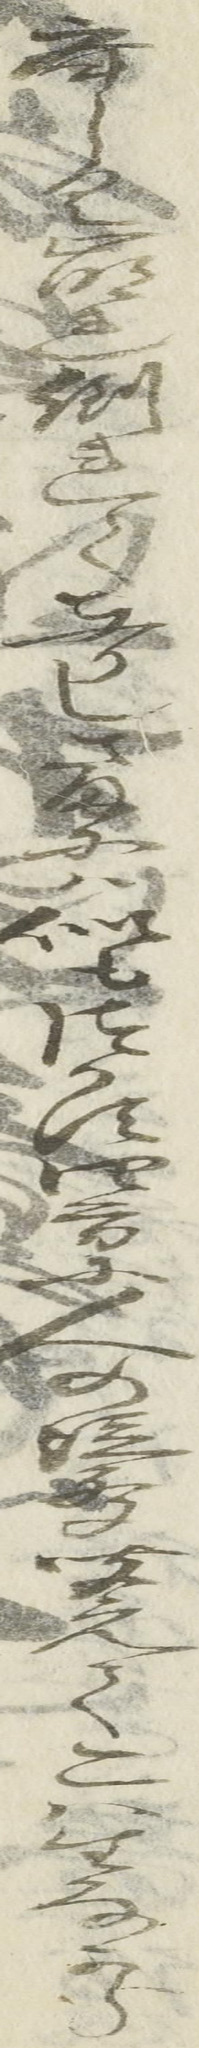斉しく崩れ倒れて在りしさまにハ似もつかす四方に人の陰聲聞えてこハ生なから
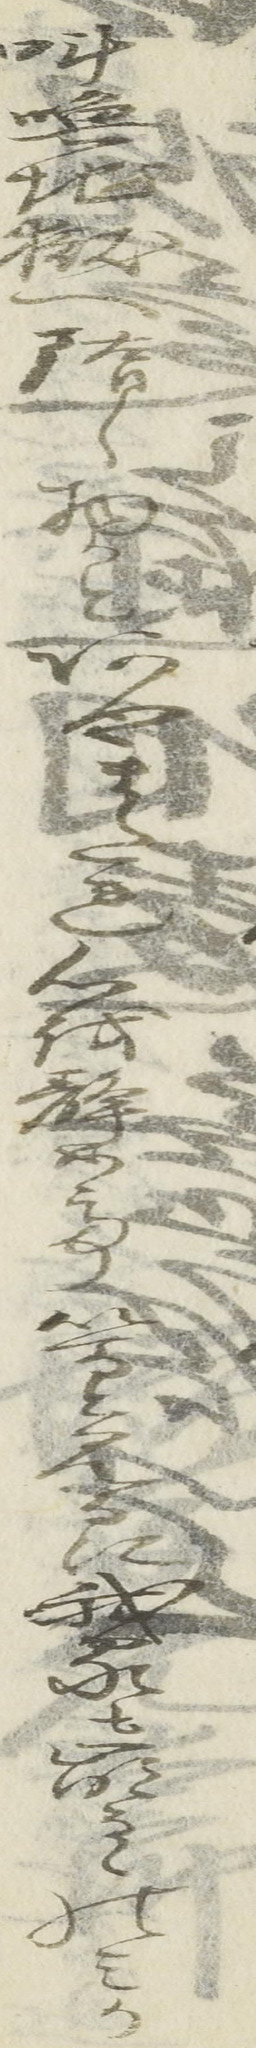叫喚地獄へ堕し物かとあやまたれ心を静めて篤と見るに我家も崩るゝのミか
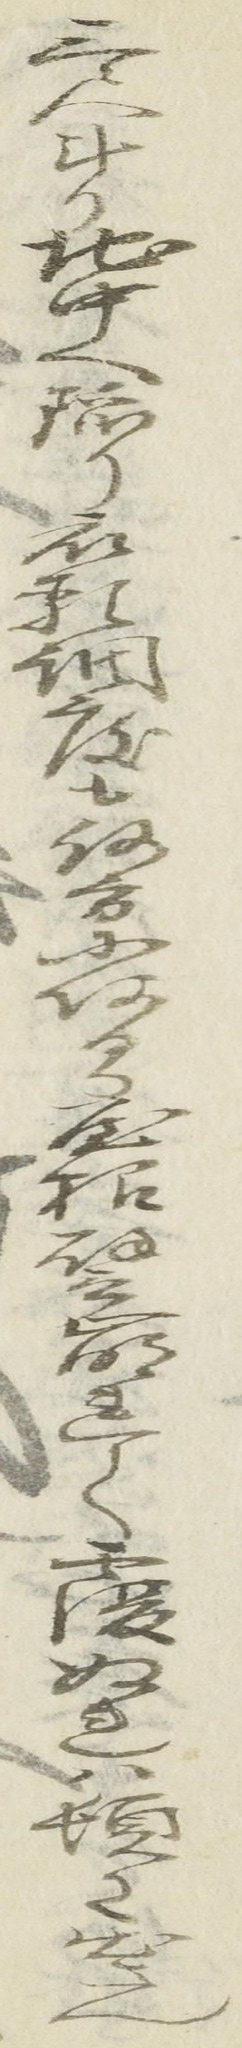三人斗り地中へ陥り衣類調度も何方にあるか屋根壁崩れて覆ぬれハ頓に出さん
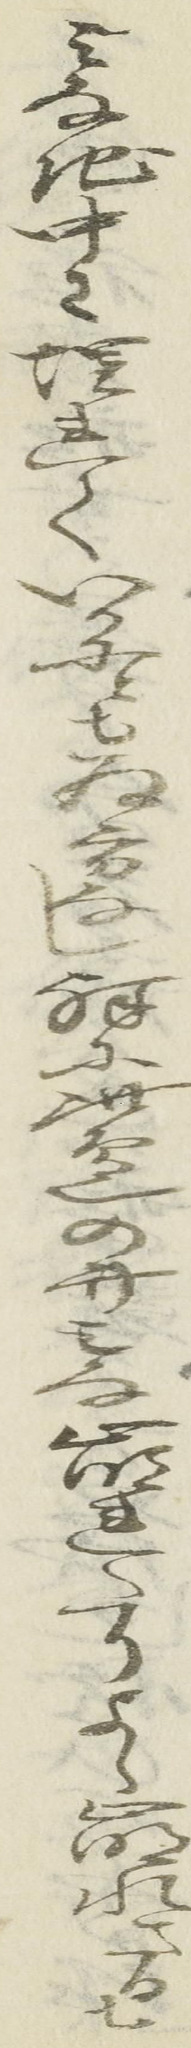ミな地中に埋れていかにも為方なし殊に此辺の井ミな崩れたりよし崩れさるモ
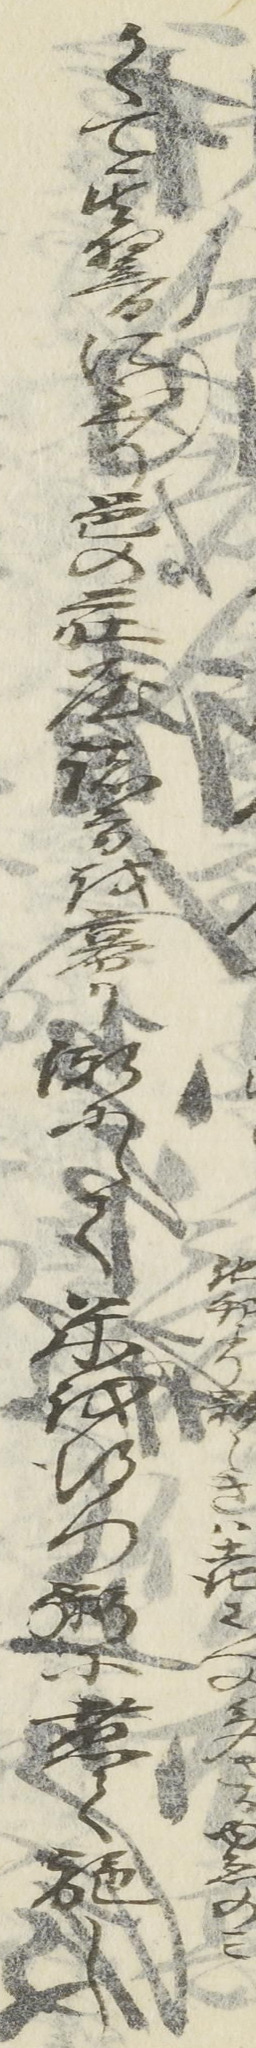かくて其翌日に至り邑の荘屋諸方を募り漸にして米を得つ粥に煮て施し
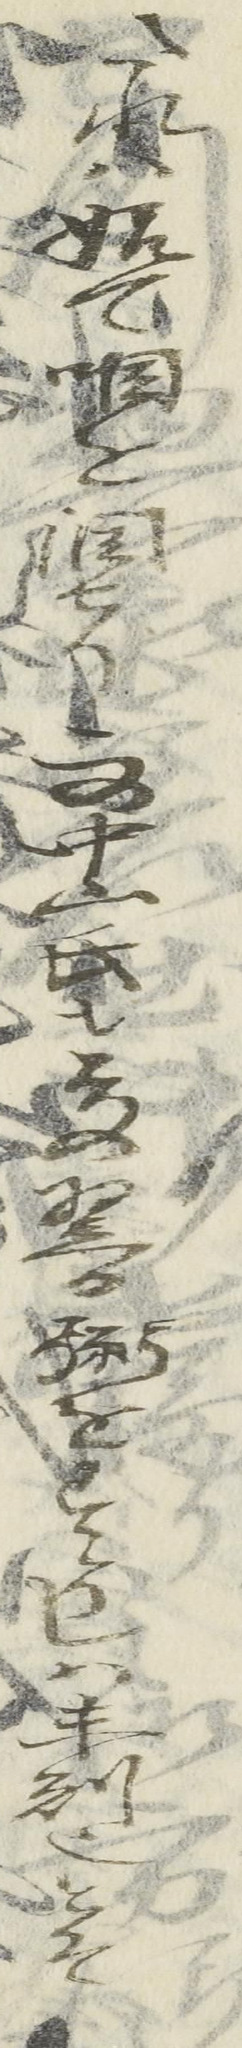たれは始て咽を潤セりこの中山氏もその翌日粥をすゝりしは未刻也とそ
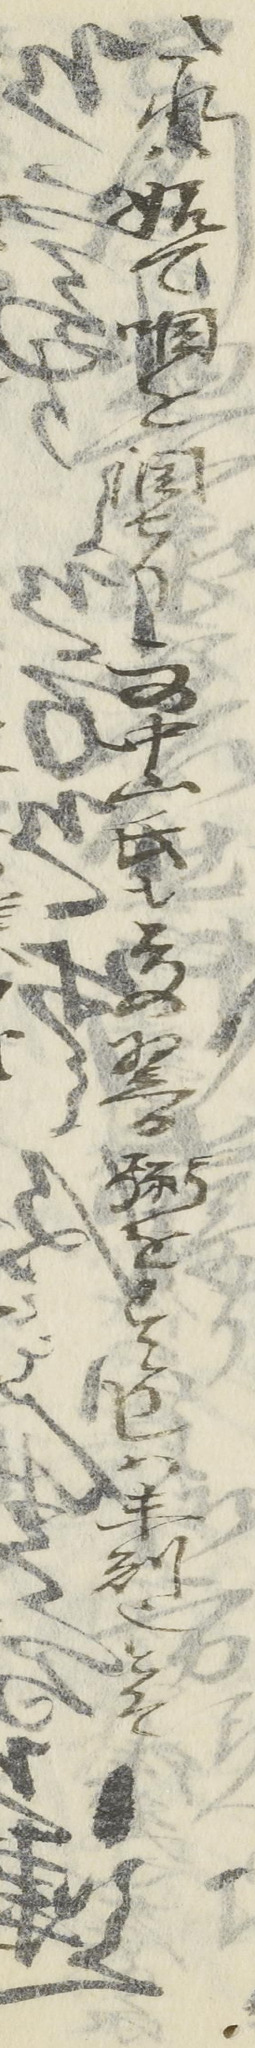たれは始て咽を潤セりこの中山氏もその翌日粥をすゝりしは未刻也とそ
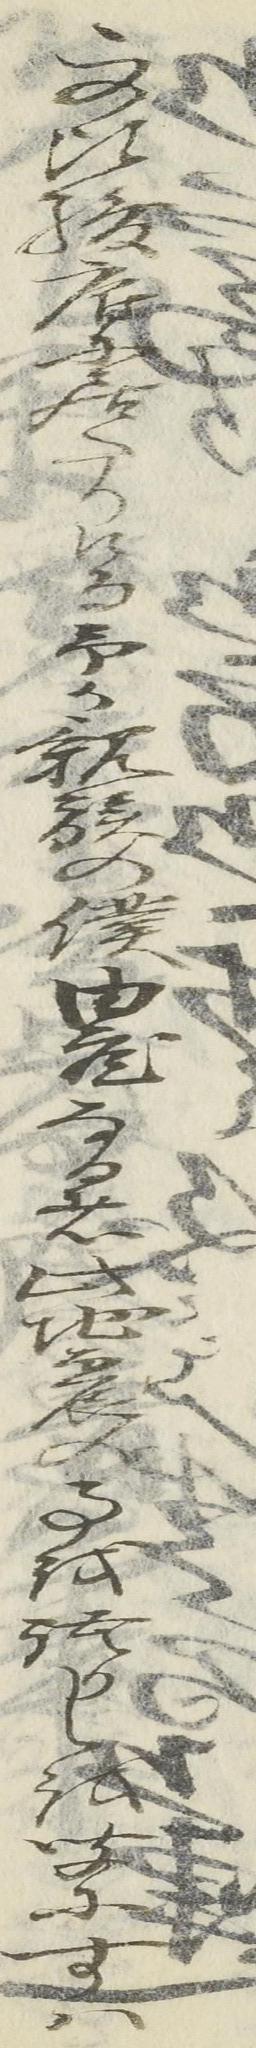この以後府に居たりケる予か親族の僕由蔵なる者此地震の事を語りしを聞にすハ
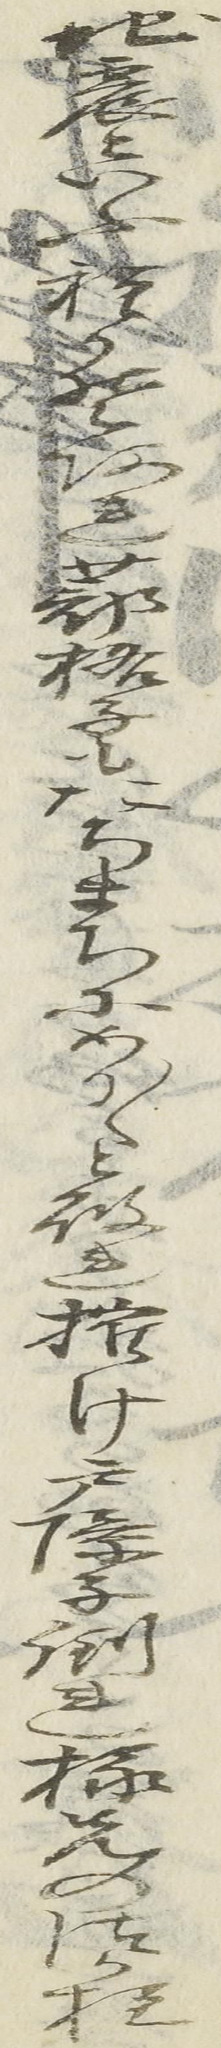地震といふ程かそあれ蔀格子もたちまちにめり〳〵と破れ摧け戸障子倒れ掾先のつケ柱
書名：安政乙卯江戸大地震筆記　安政丙辰八月大阪大雷雨之記追加　安政三辰年七月松前辺大地震并八月大風雨記録
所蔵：東京大学地震研究所図書室 Earthquake Research Institute Library, The University of Tokyo, JAPAN
